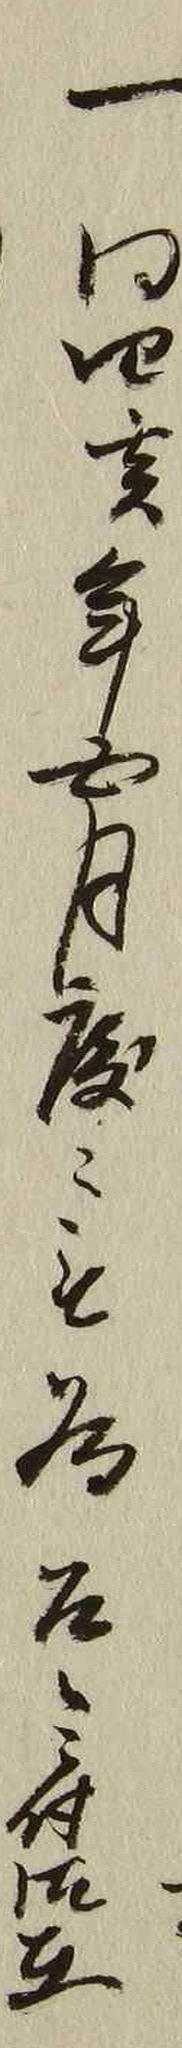一同四亥年五月度々被為召候ニ付御在
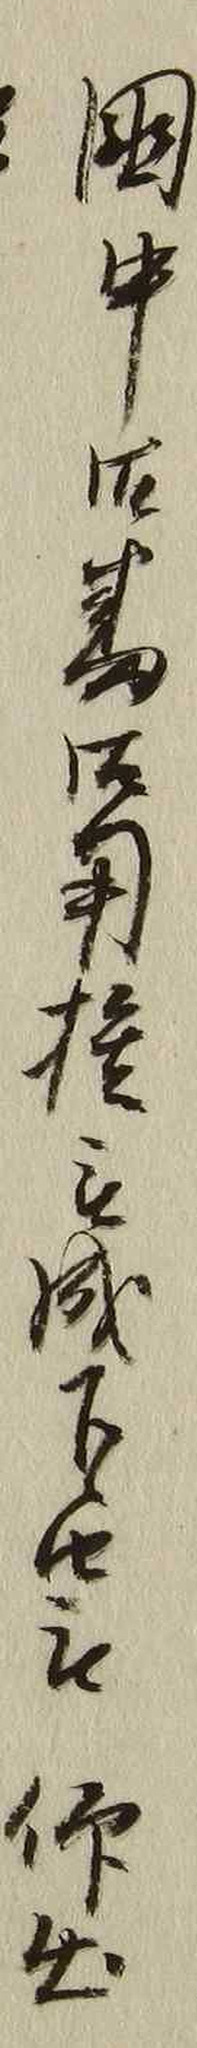国中御番御用捨被成下候由被仰出
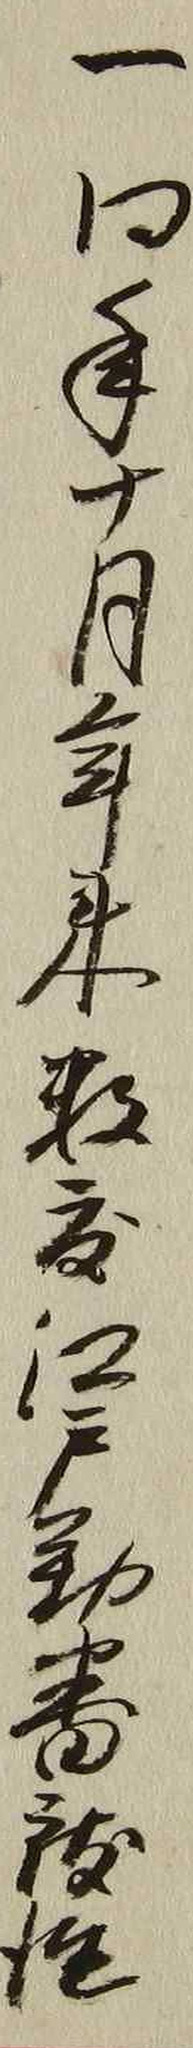一同年十月年来数度江戸勤番致往
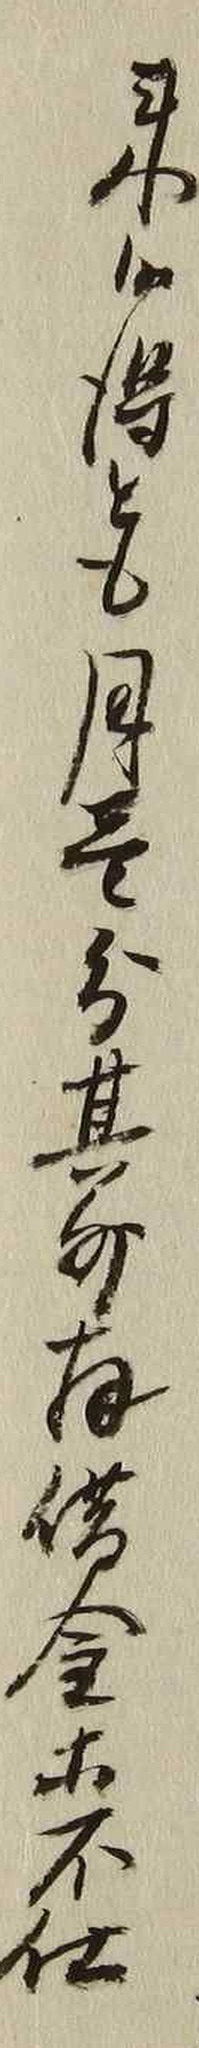来候得とも月壱分其外拝借金等不仕
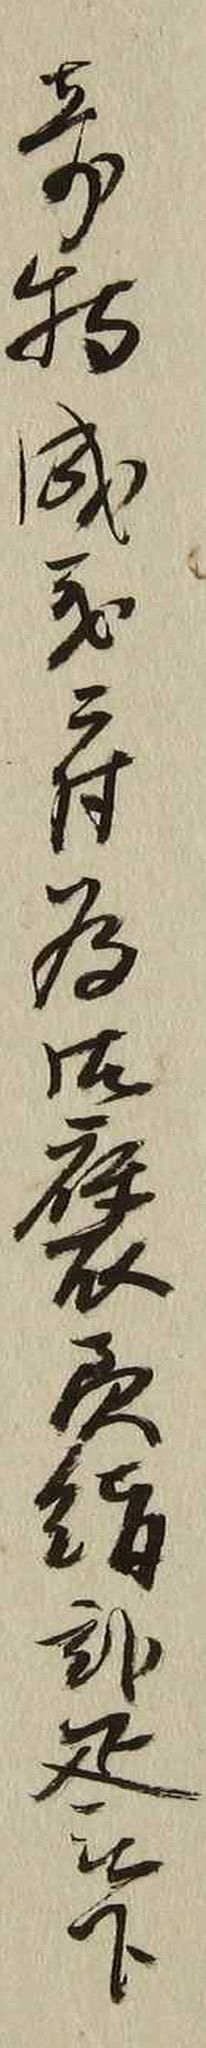奇特成義ニ付為御褒美絹弐疋被下
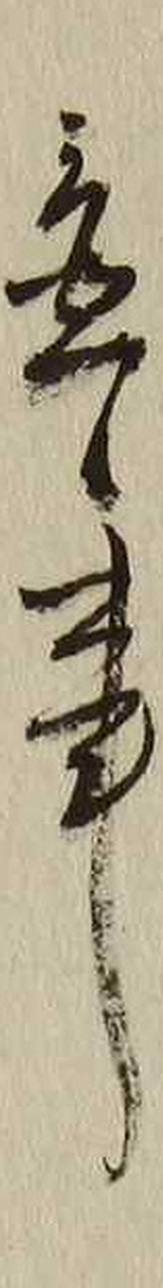置候事
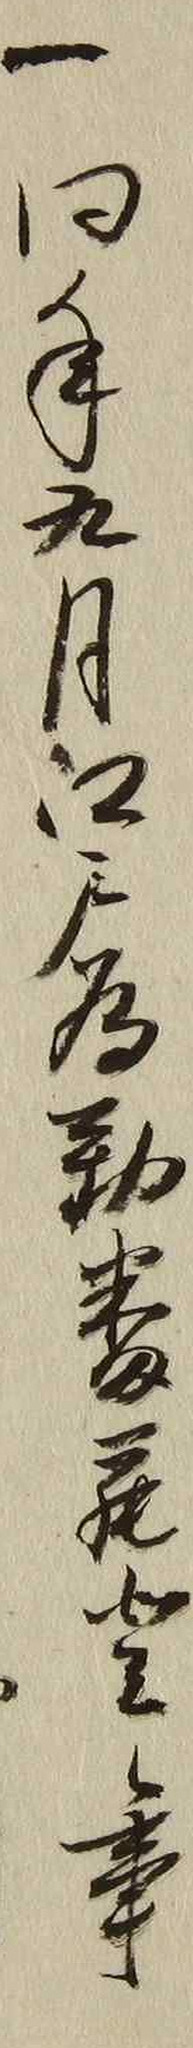一同年九月江戸為勤番罷登候事
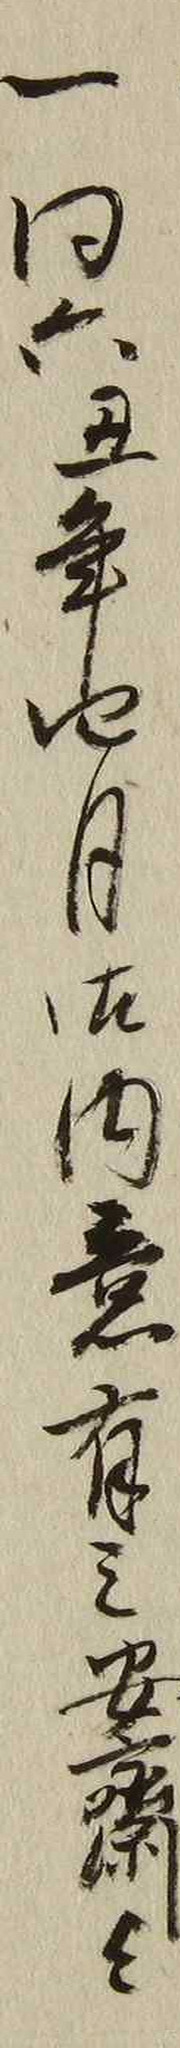一同六丑年四月御内意有之安斎与
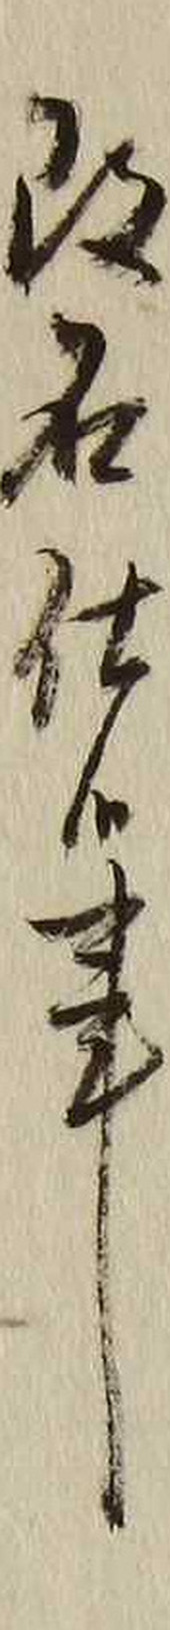改石仕候事
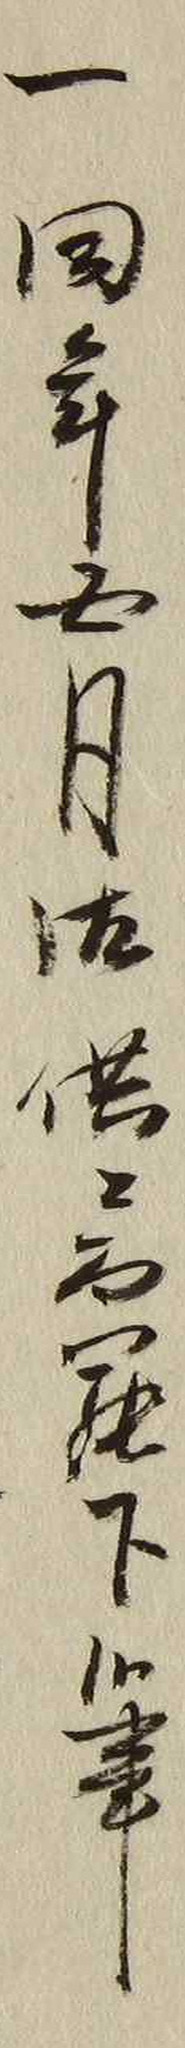一同年五月御供ニ而罷下候事
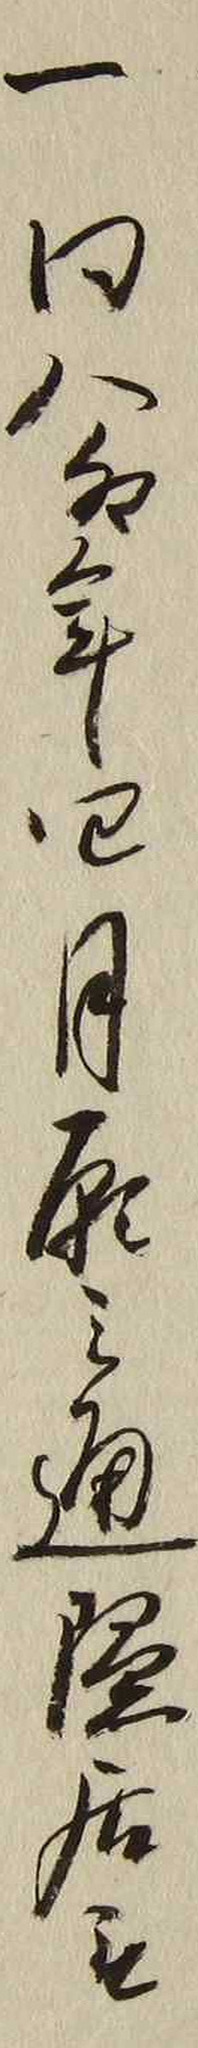一同八卯年四月願之通隠居被
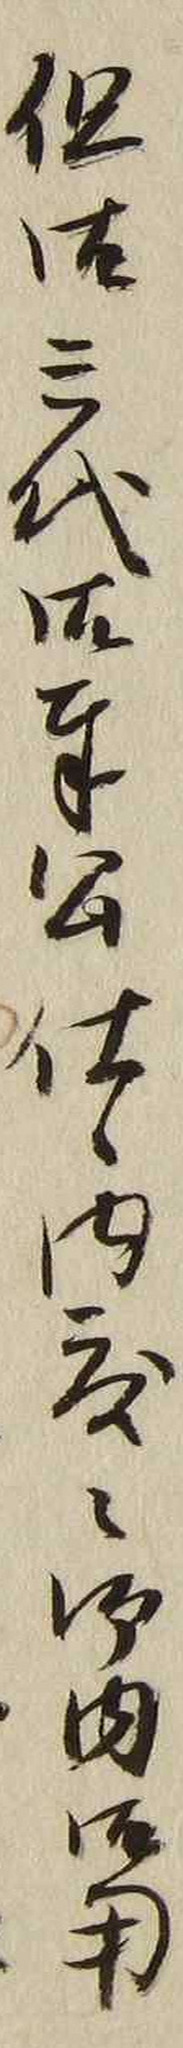但御三代御奉公仕候内度々御内御用
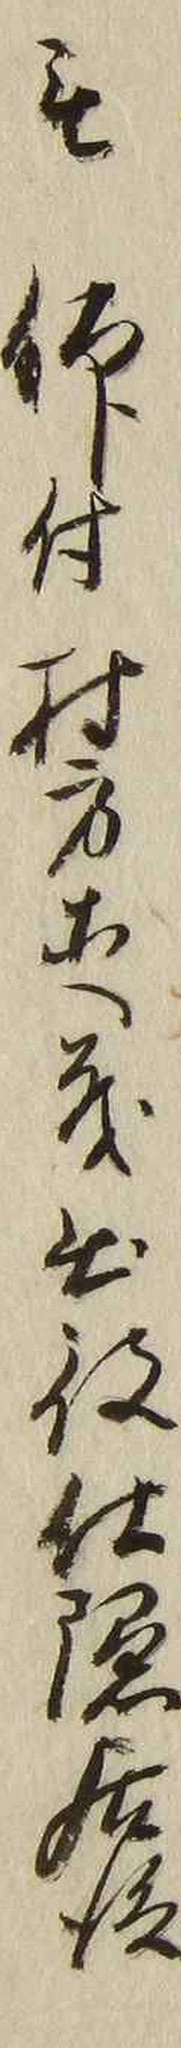被仰付村方等へ茂出役仕隠居後

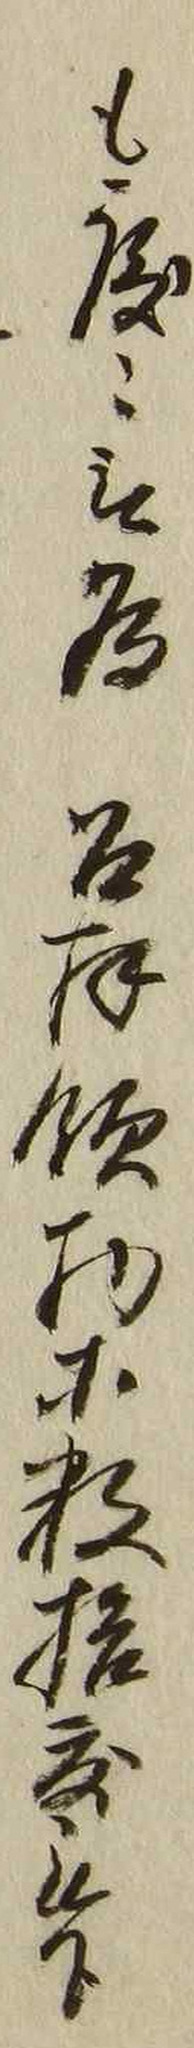も度々被為召拝領物等数度被下
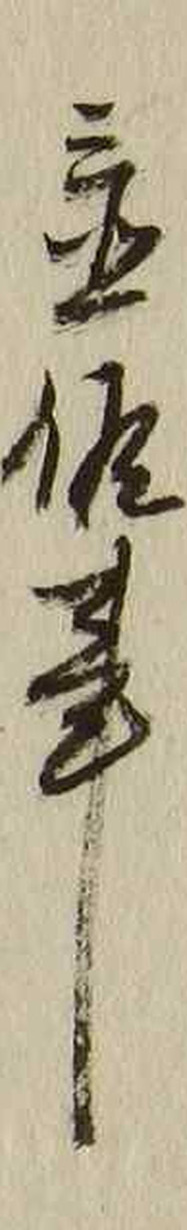置候事
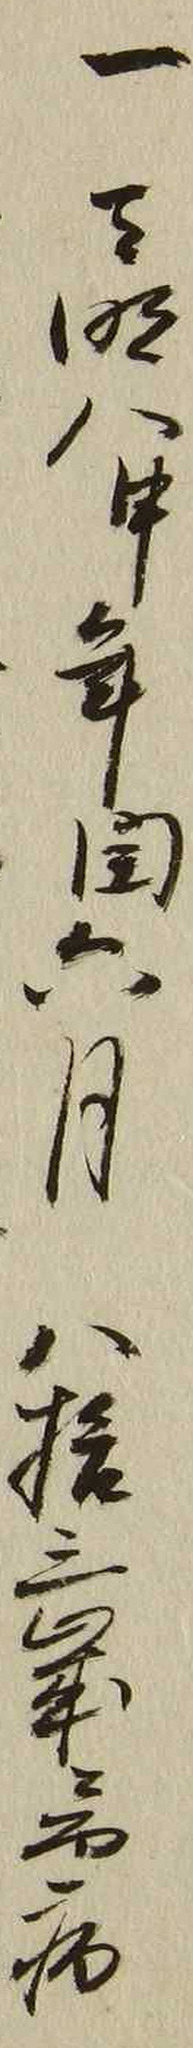一天明八申年閏六月八拾三歳ニ而病
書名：諸士系譜　巻之349　も之部5
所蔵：会津若松市立会津図書館
